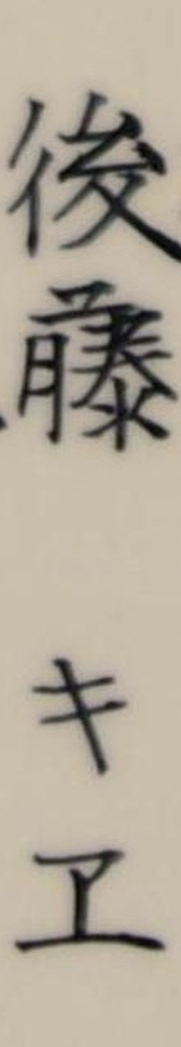後藤キエ
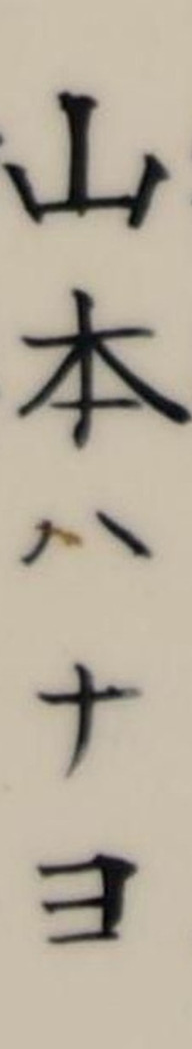山本ハナヨ
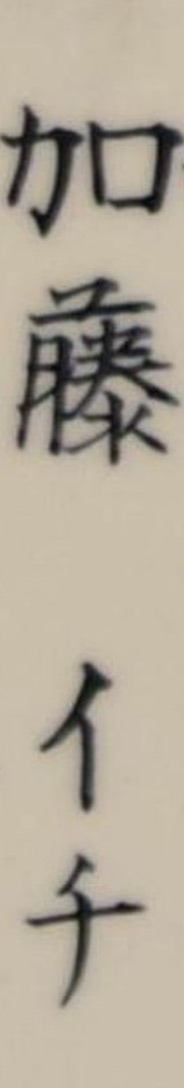加藤イチ
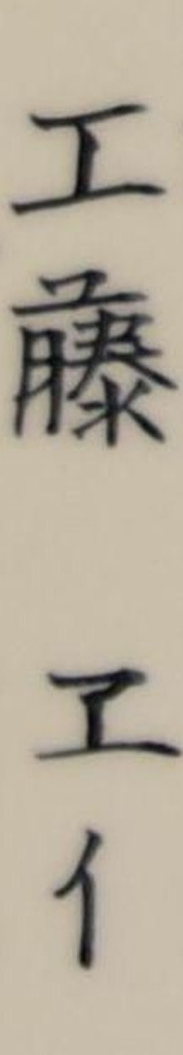工藤エイ
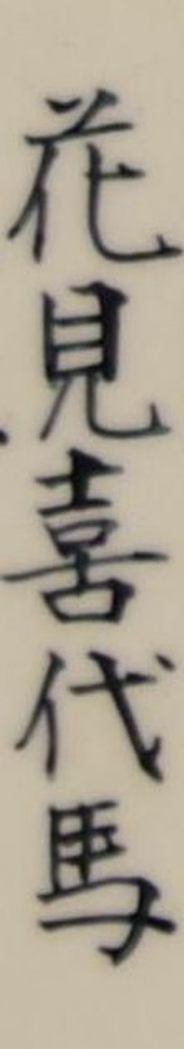花見喜代馬
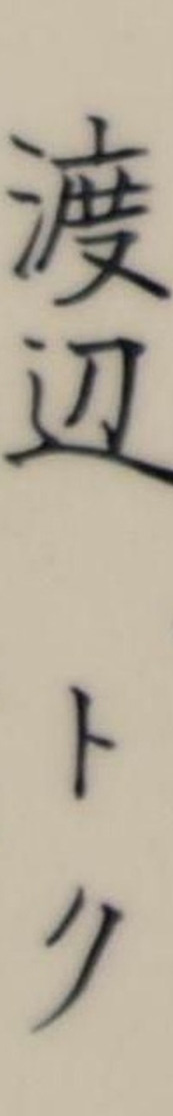渡辺トク
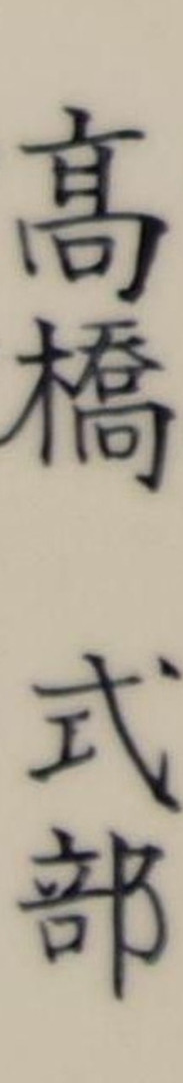高橋式部
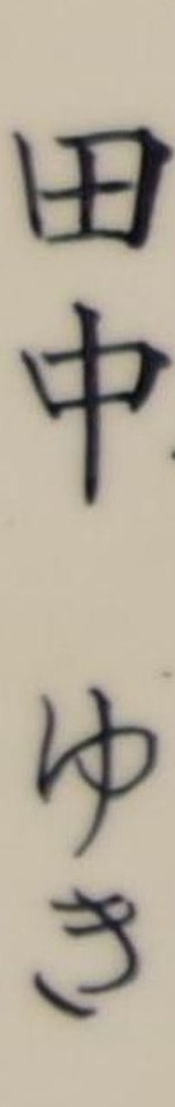田中ゆき
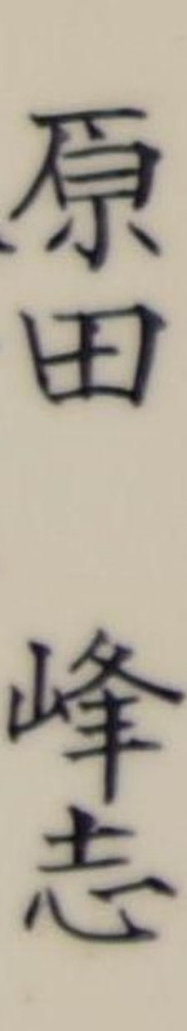原田峰志
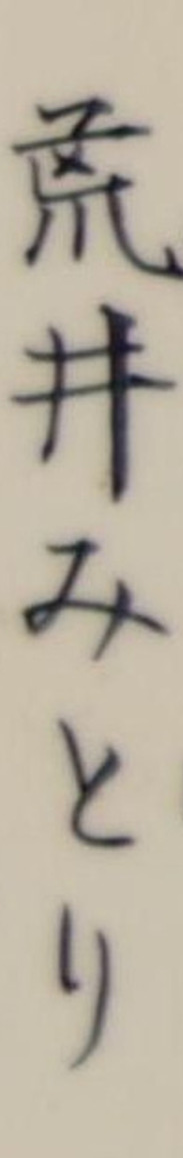荒井みとり
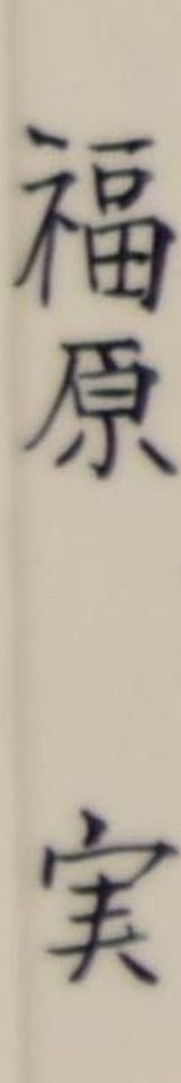福原実

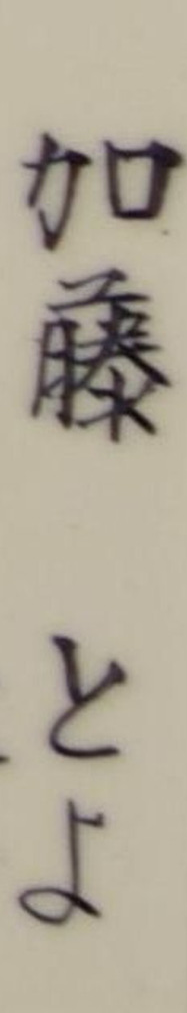加藤とよ
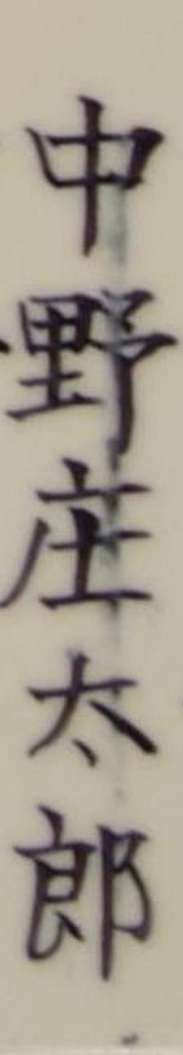中野庄太郎
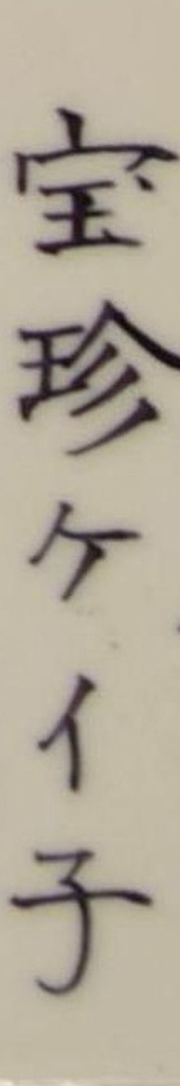宝珍ケイ子
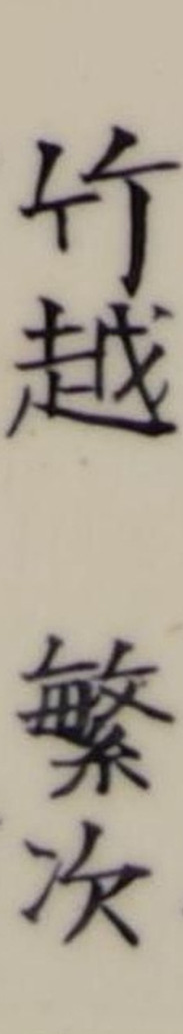竹越繁次
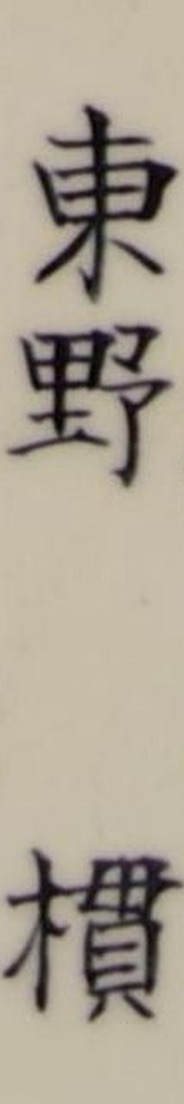東野樌
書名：M~S
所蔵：高野山金剛峯寺
